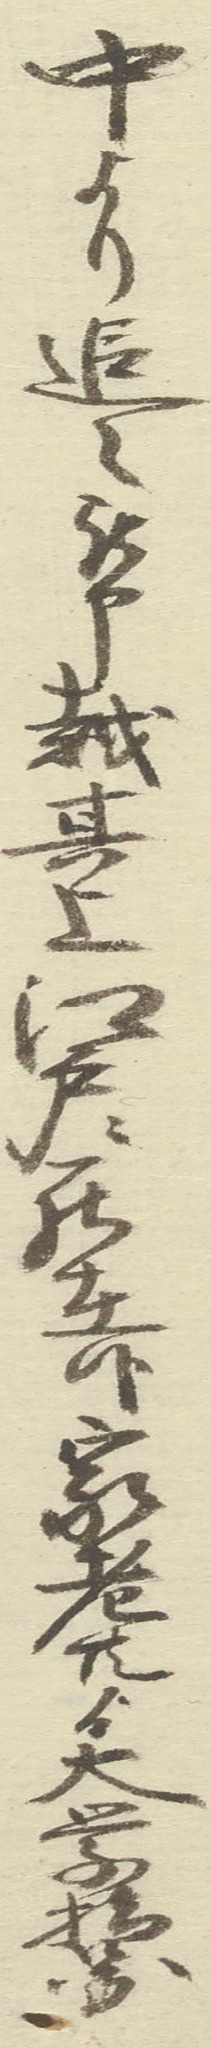中より追〻被申越其上江戸ニ罷在候家老共ゟ大学指図
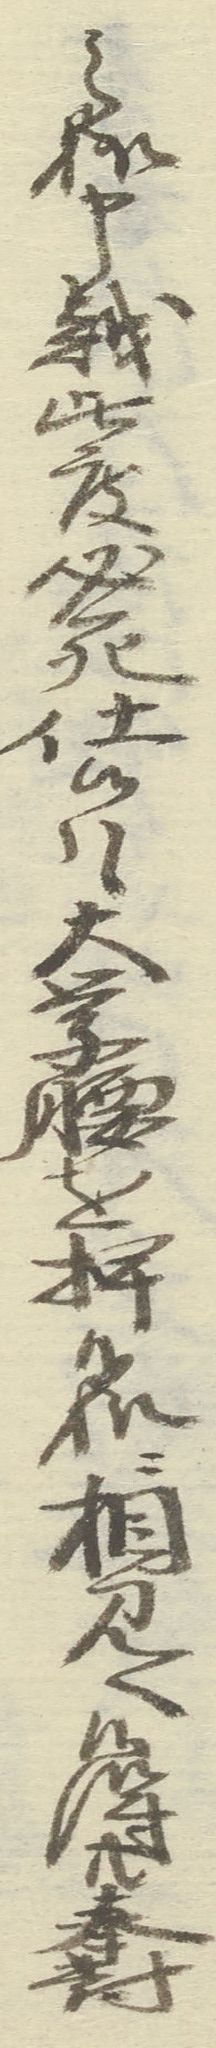之様申越此度必死仕候ハヽ大学腰を押候様ニ相見へ候得共奉對
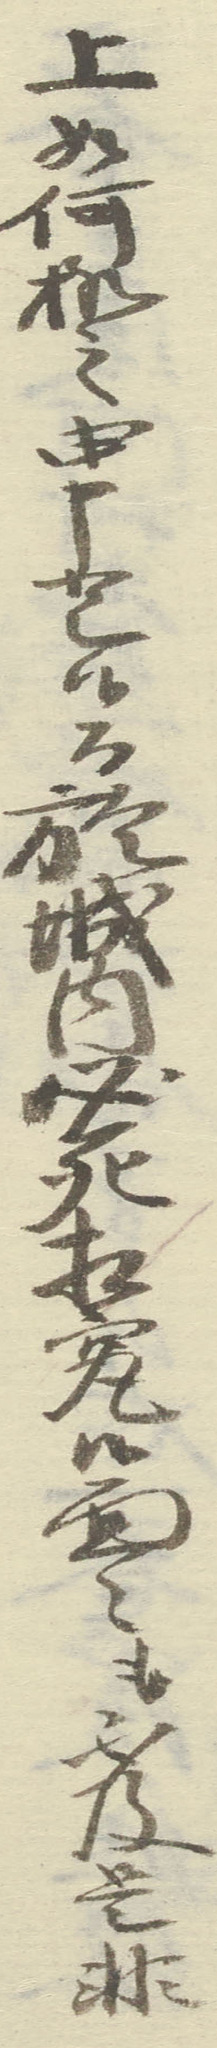上如何様之由申と候而於城内必死相究候面〻も不及是非
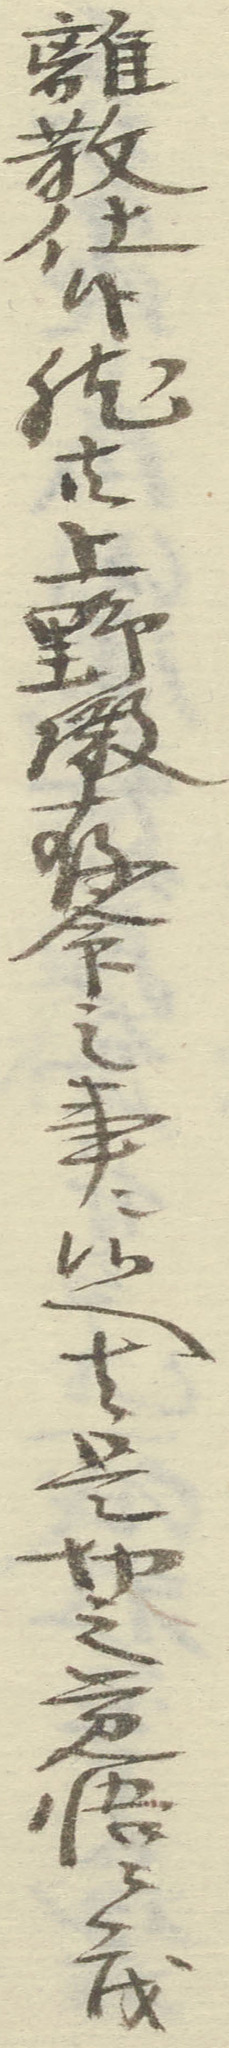離散仕候然共上野殿存命之事ニ候へは是切之覚悟ニも
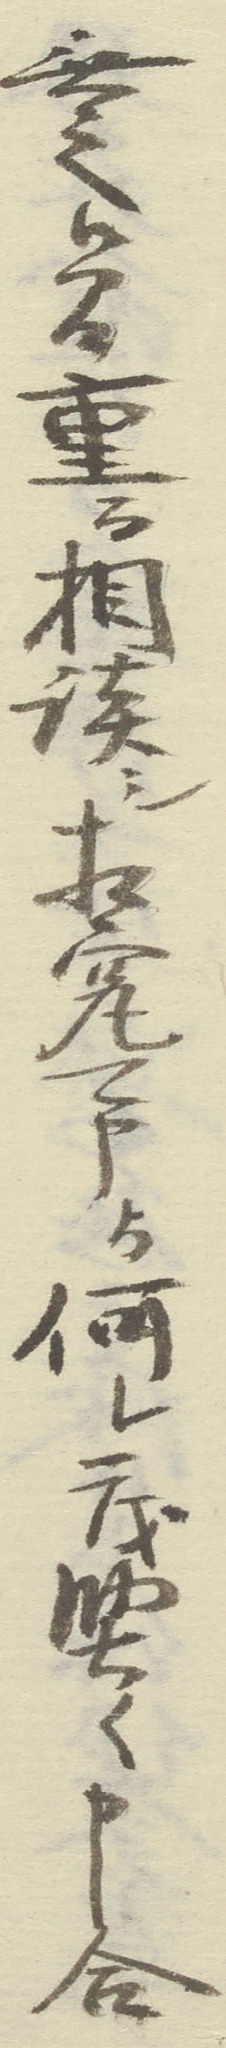無之候間重而相談シ相究可申と何レも堅く申合
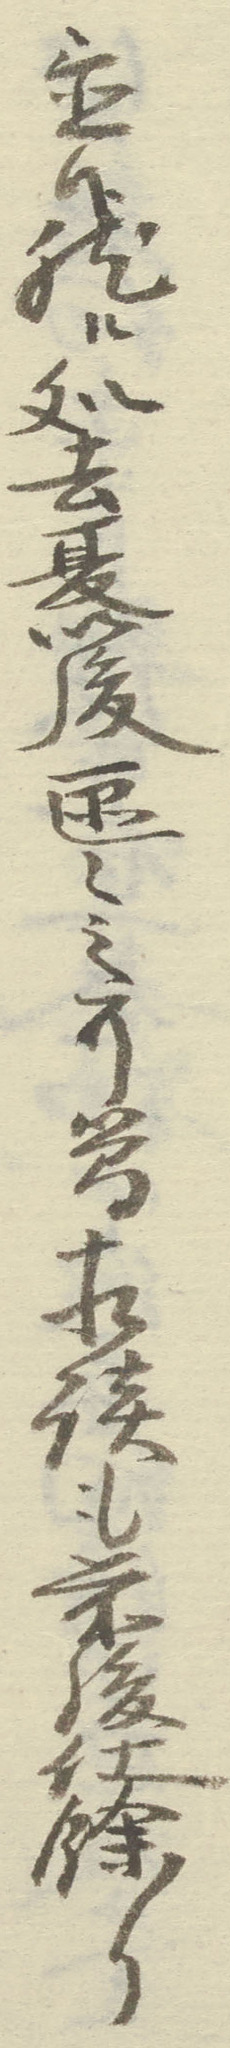置候然ル処去夏以後區〻之了簡相談も前後仕餘り
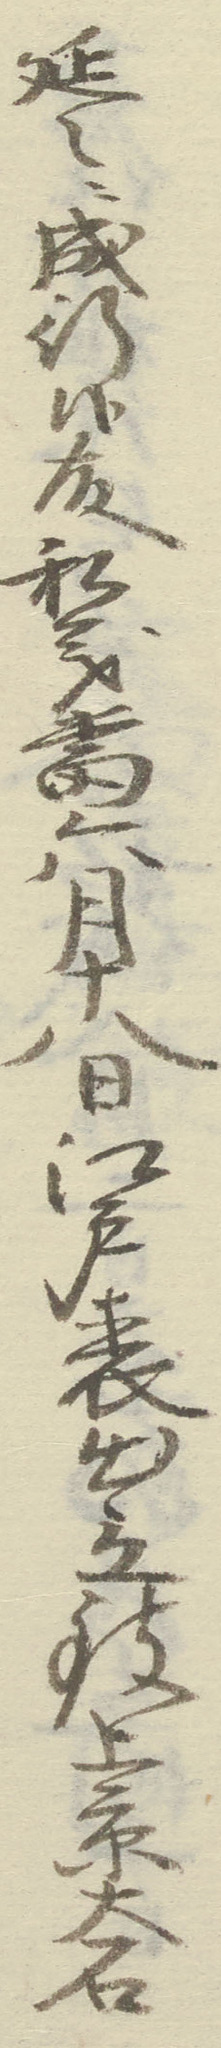延候ニ成行候故私義當六月十八日江戸表出立致上京大石
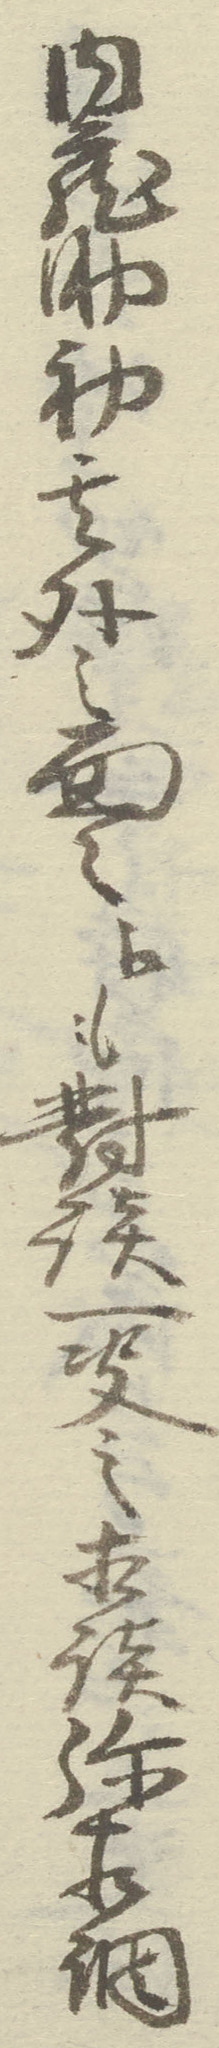内蔵助初其外之面〻江も對談一決之相談弥相調
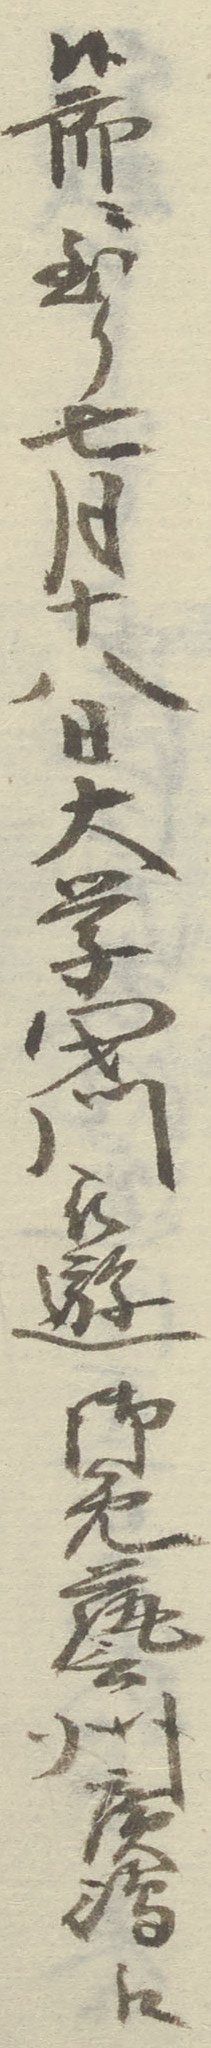候節ニ至り七月十八日大学閉門被遊御免藝州廣嶋江

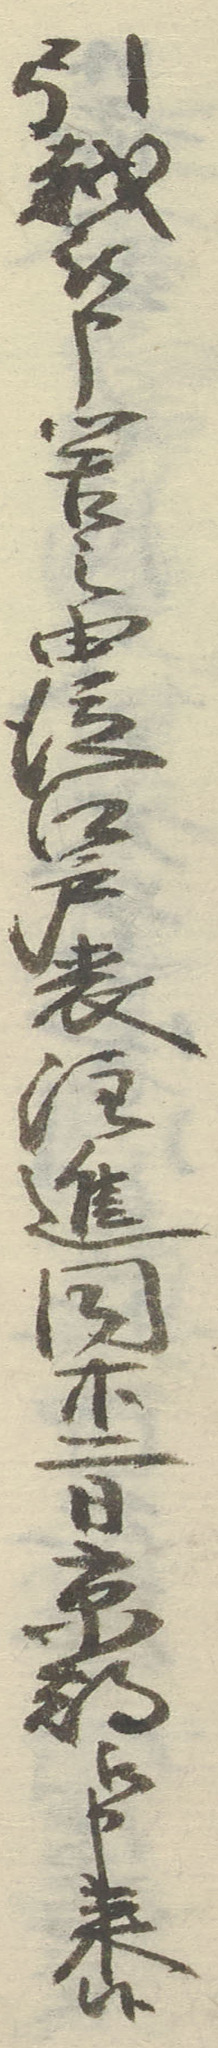引越被申筈之由従江戸表注進同廿二日京都江申来候
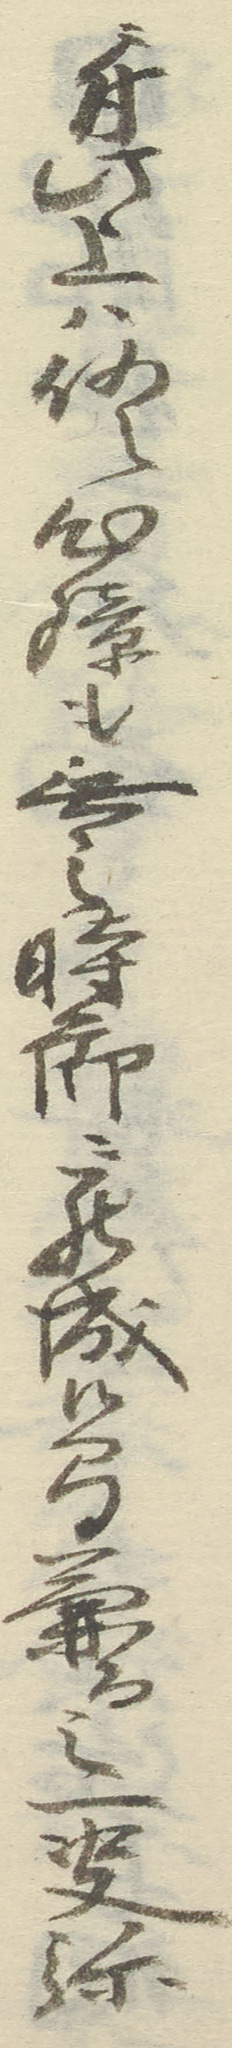ニ付此上ハ何之心障も無之時節ニ罷成候間兼而之一決弥
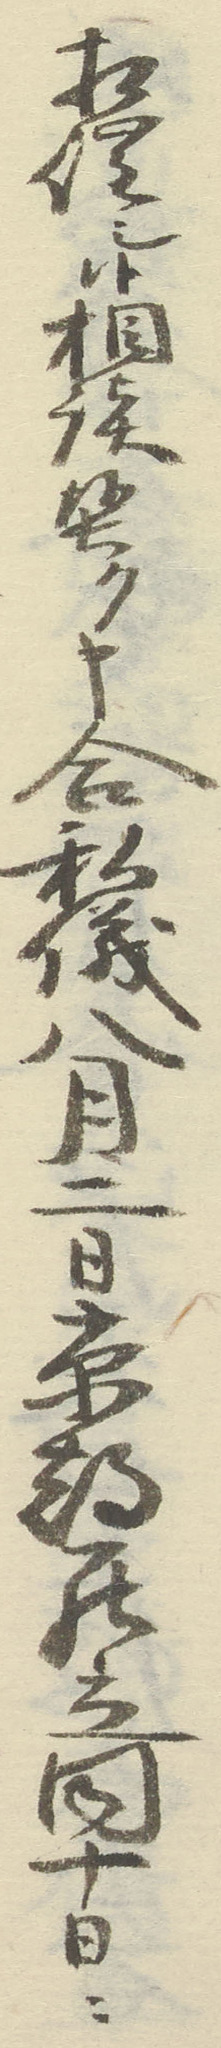相催シ候相談堅ク申合私儀八月二日京都罷立同十日ニ
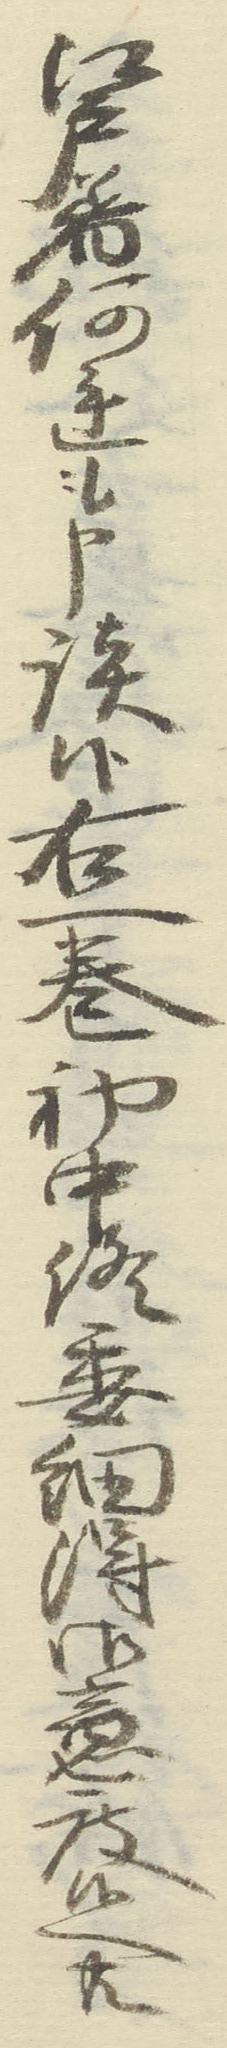江戸着何れも申談候右一巻初中終委細得御意度候へ共
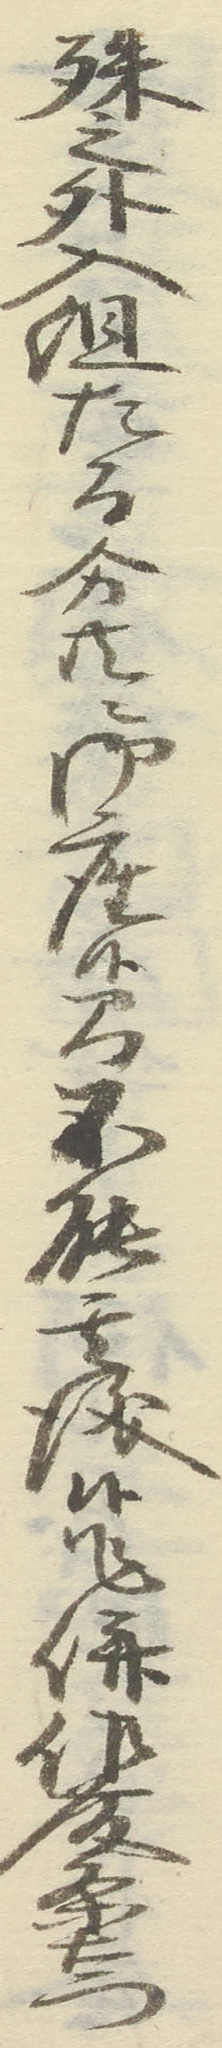殊之外入組たる分共ニ御座候間不能其儀候乍併佐藤条右衛門
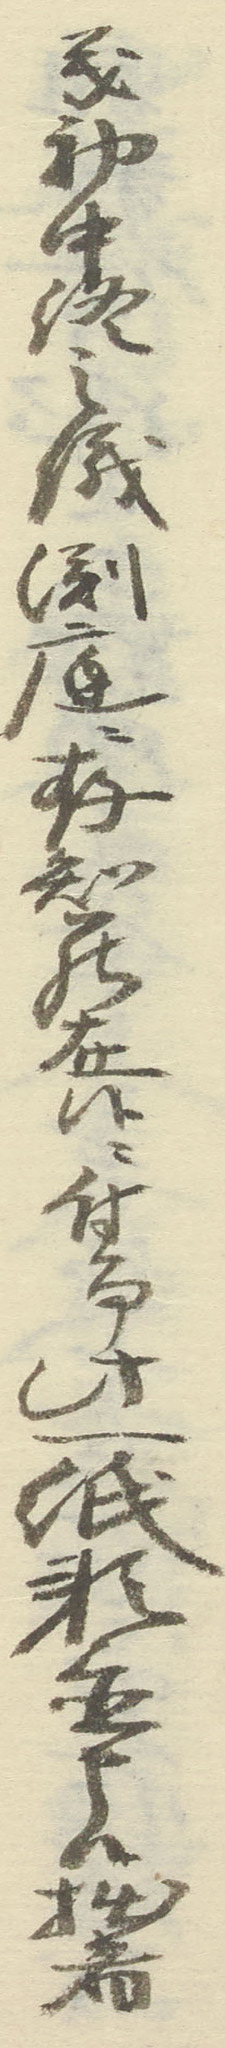義初中終之儀淵底ニ存知罷在候ニ付而此一紙頼置申候拙者
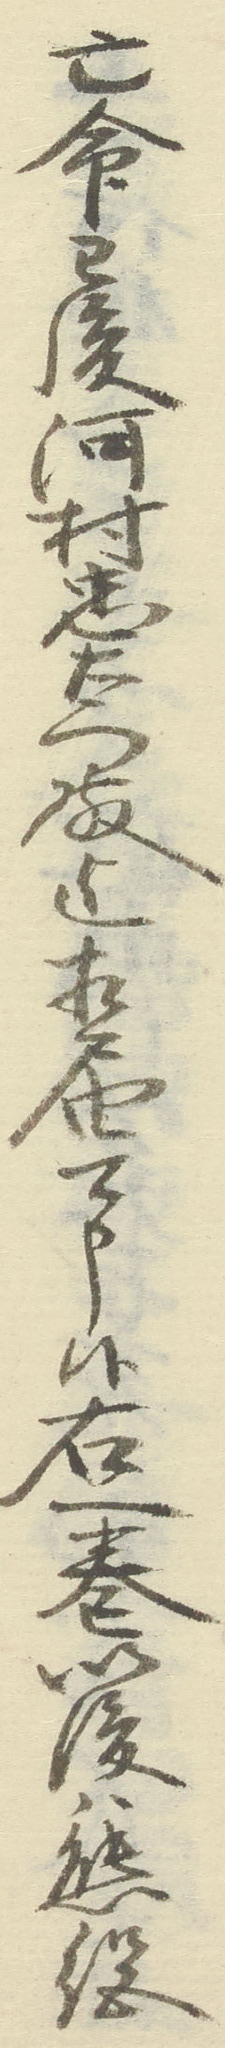亡命已後河村忠右衛門殿迄相届可申候右一巻以後ハ態絶
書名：[七月二日京都大地震に付御番衆大木市左衛門より申し越し候書面畧書状写]
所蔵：東京大学総合図書館 General Library in the University of Tokyo, JAPAN
